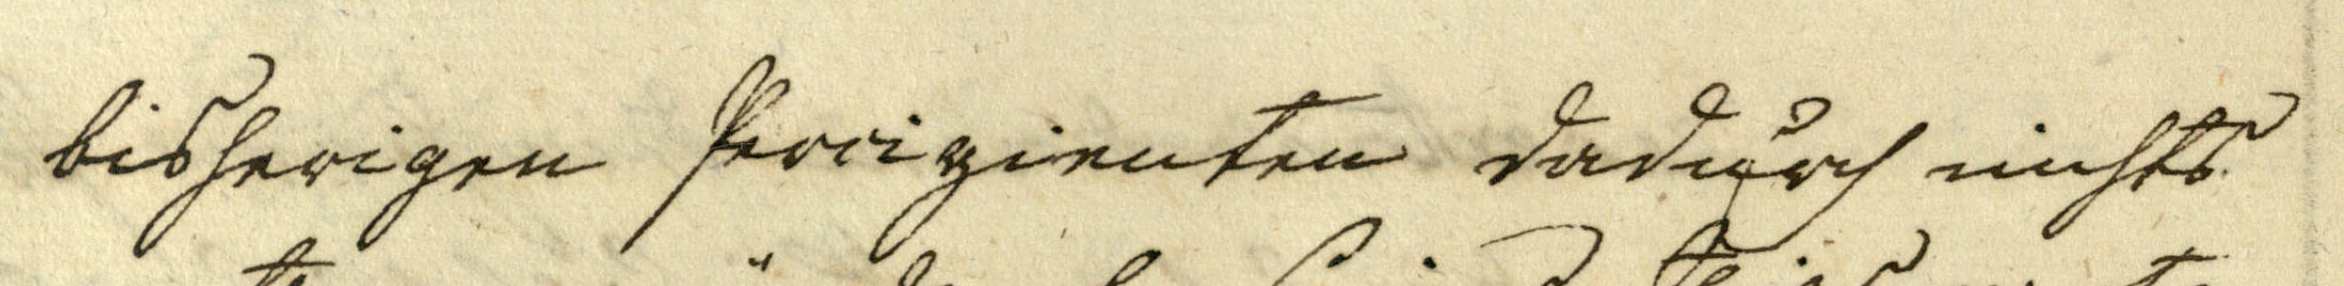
bisherigen Percipienten dadurch nichts
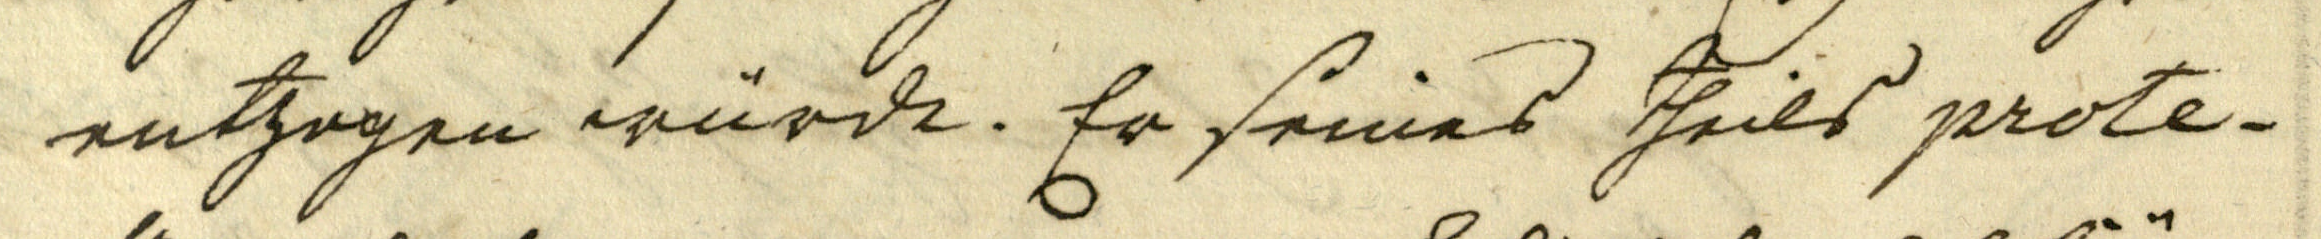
entzogen würde. Er seines Theils prote¬
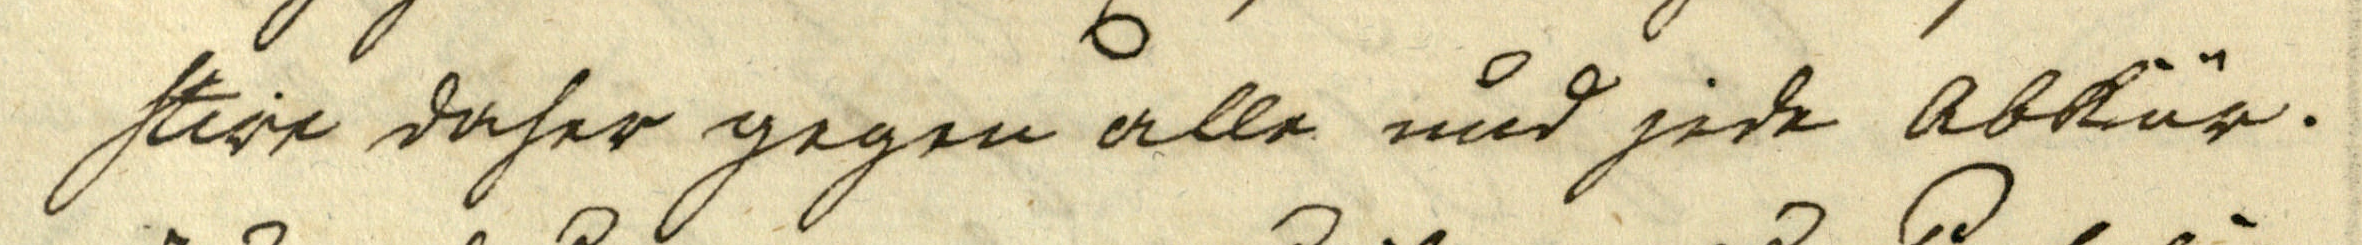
stire daher gegen alle und jede Abkür¬
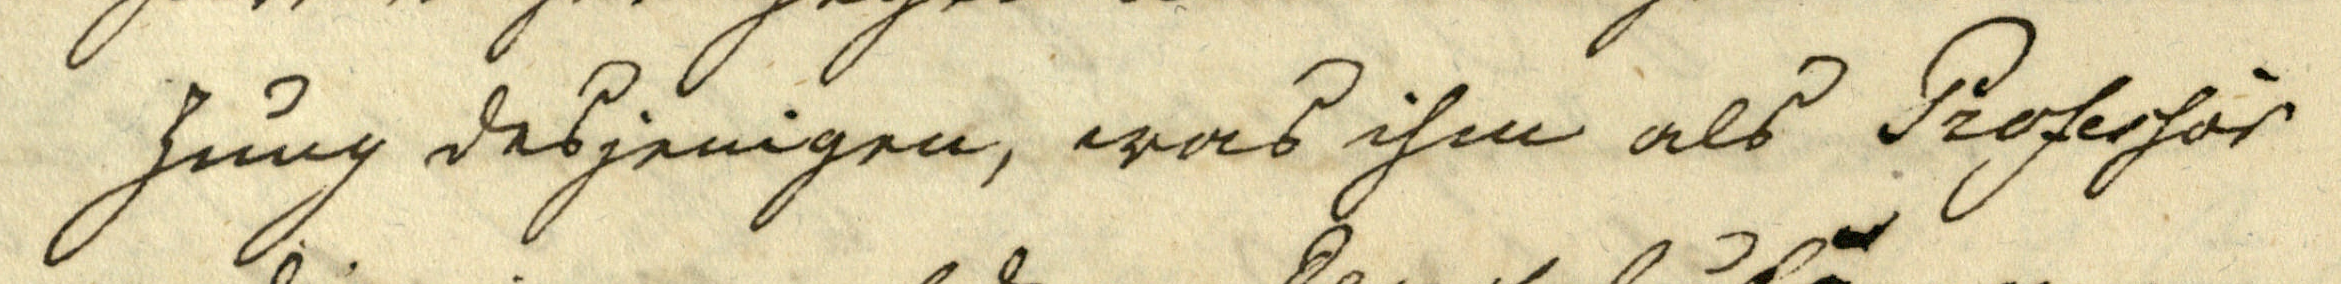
zung desjenigen, was ihm als Professor
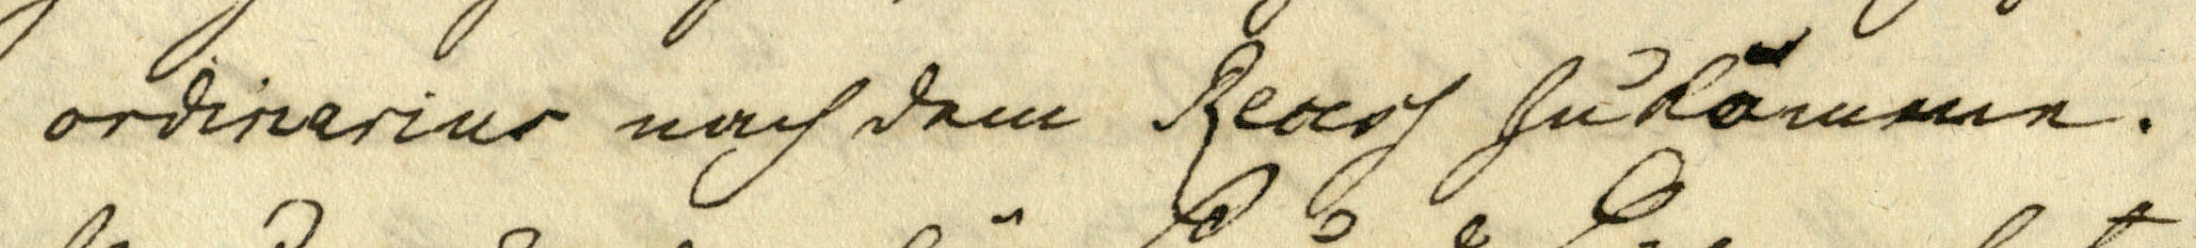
ordinarius nach dem Recess zukomme.
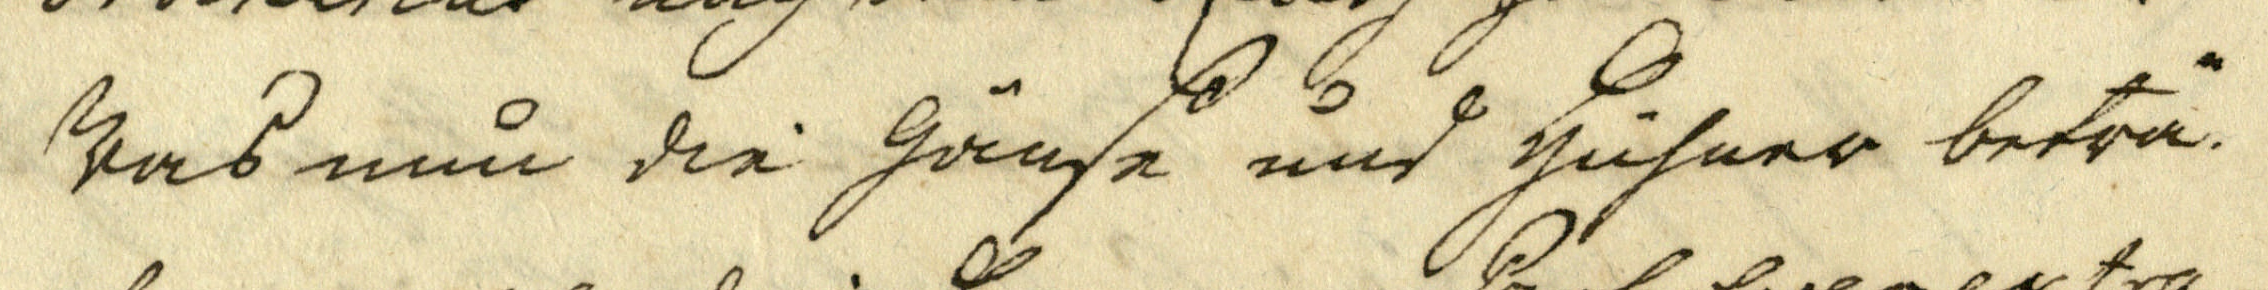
Was nun die Gänse und Hühner beträ¬
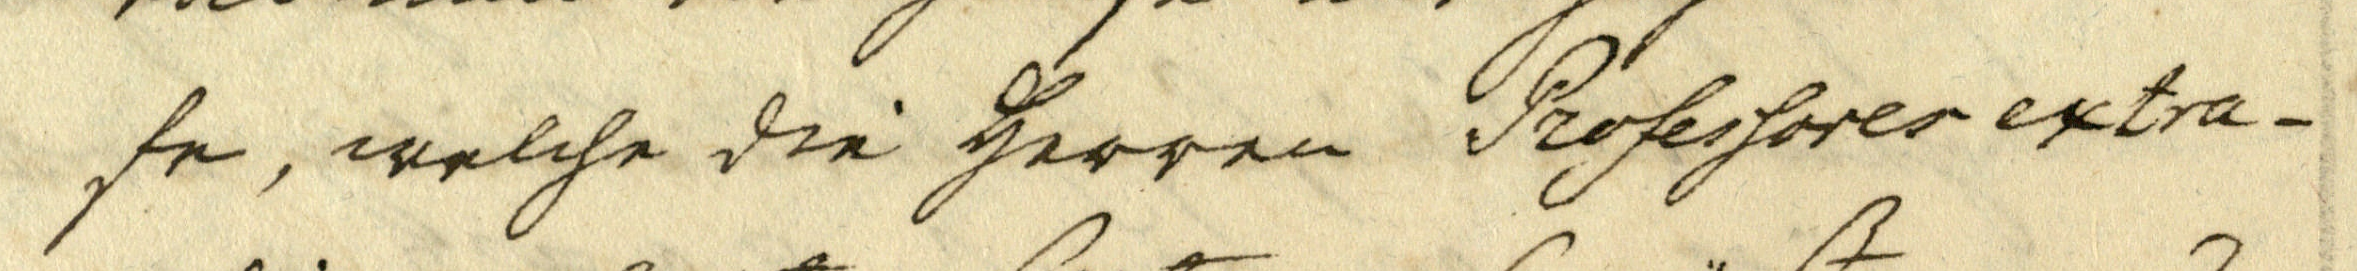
fe, welche die Herren Professores extra¬
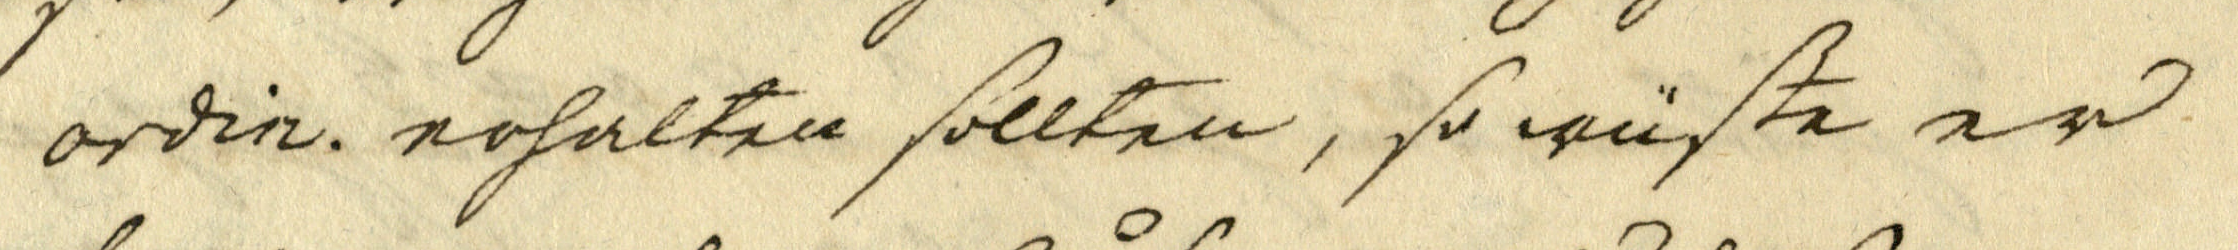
ordin. erhalten sollten, so wüßte er
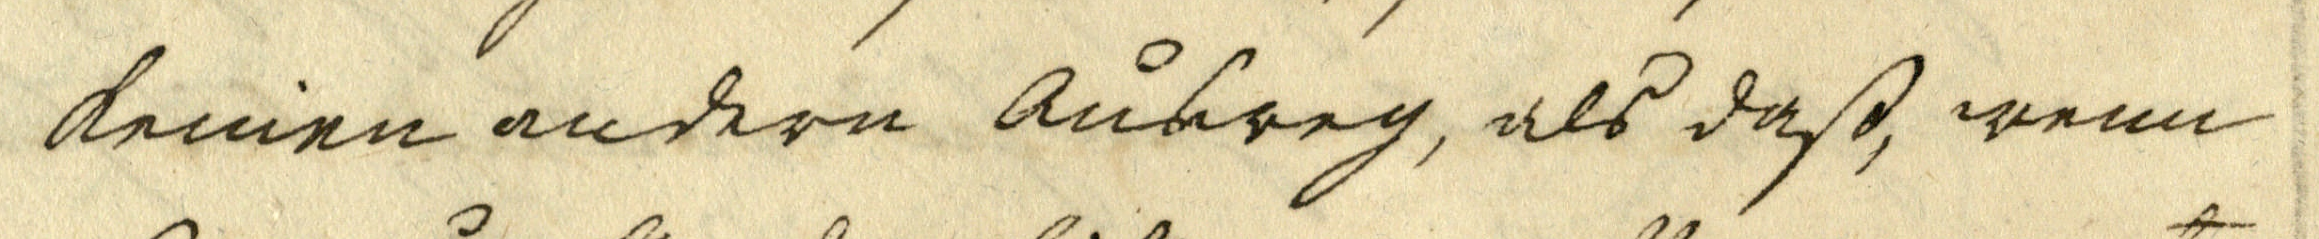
keinen andern Ausweg, als daß, wenn
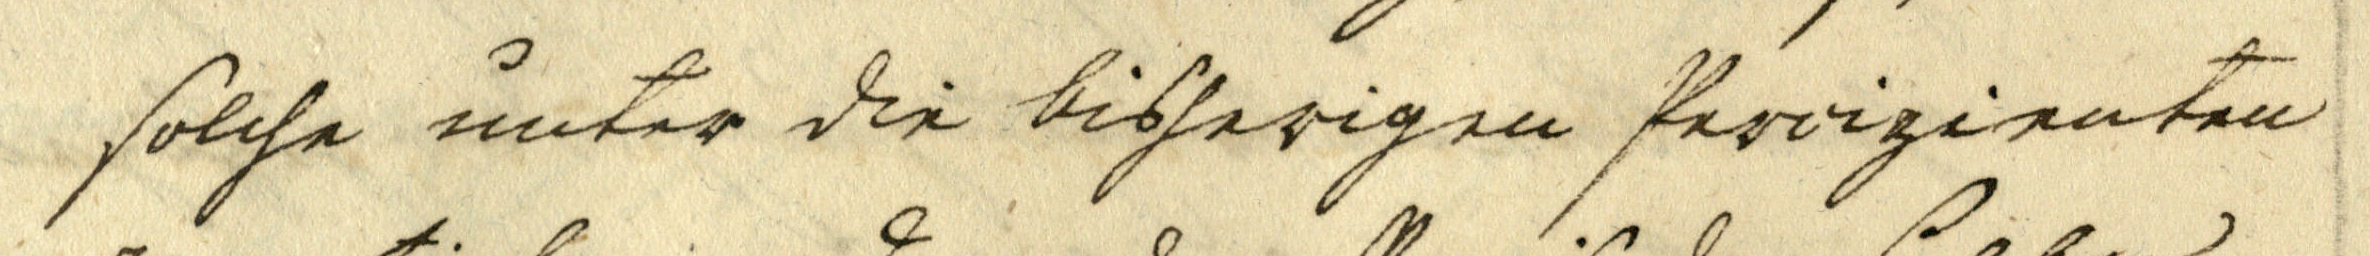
solche unter die bisherigen Percipienten
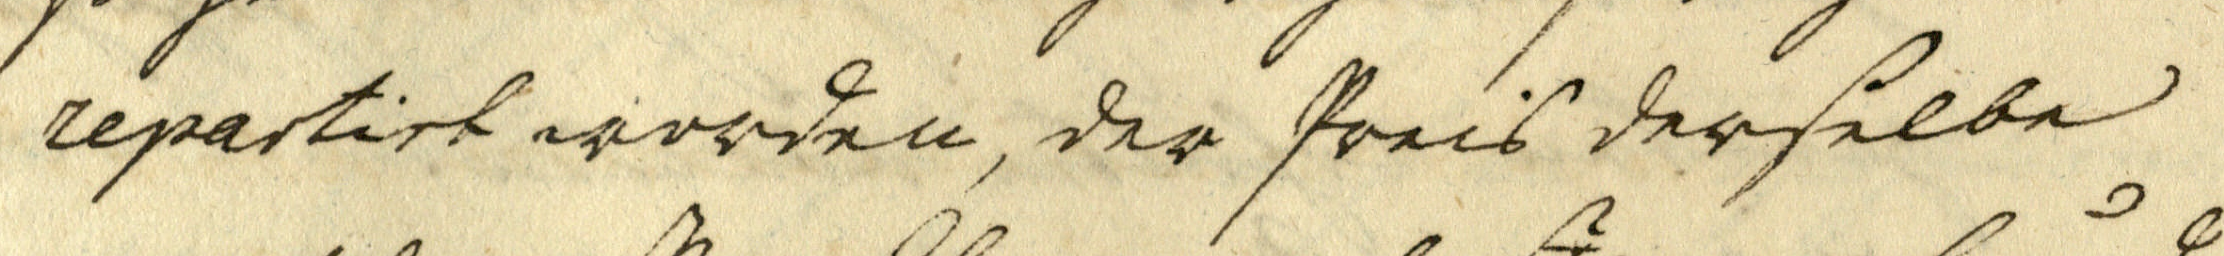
repartirt worden, der Preis derselbe
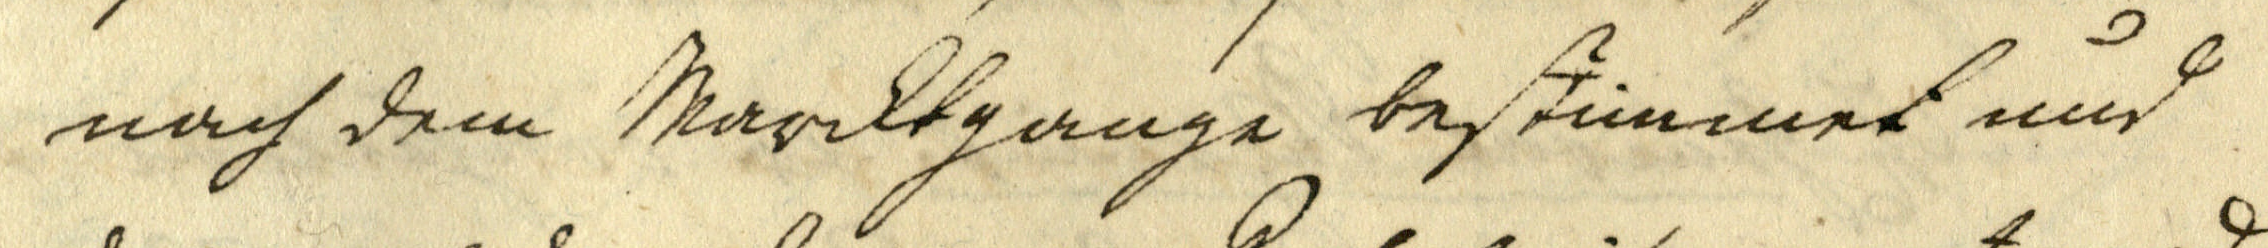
nach dem Marcktgange bestimmet und
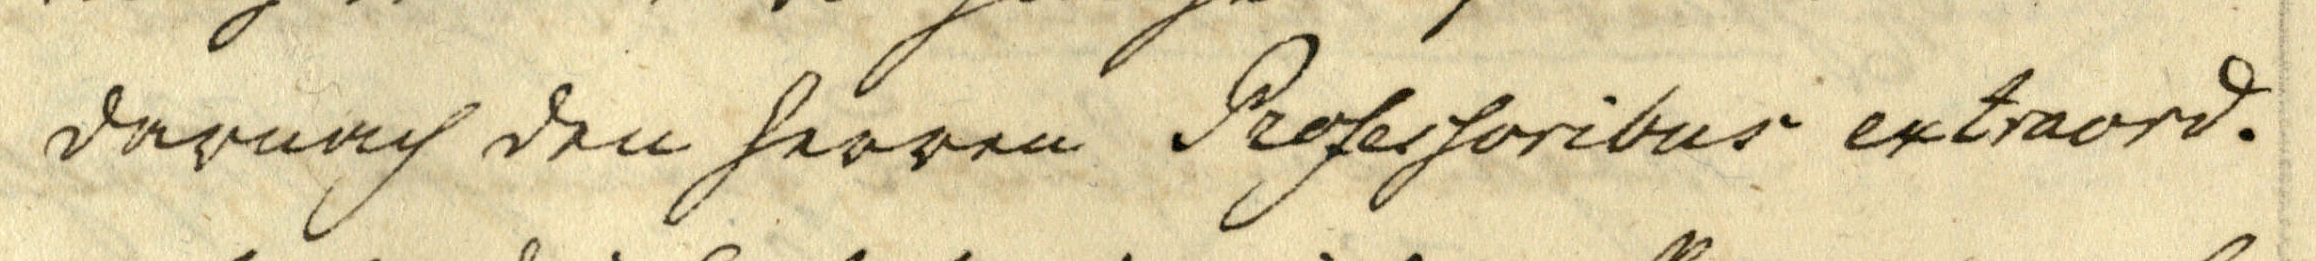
darnach den Herren Professoribus extraord.
